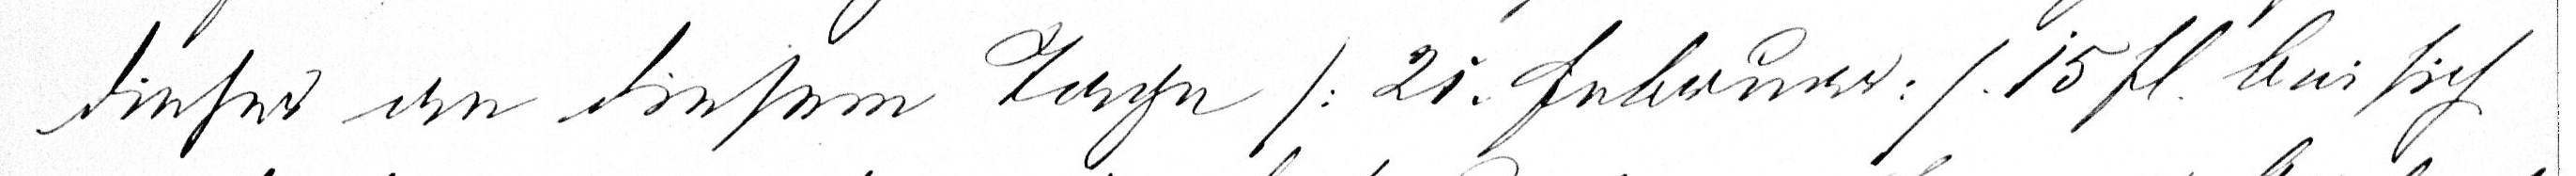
dieser an diesem Tage /:21. Februar:/ 15 fl. bei sich
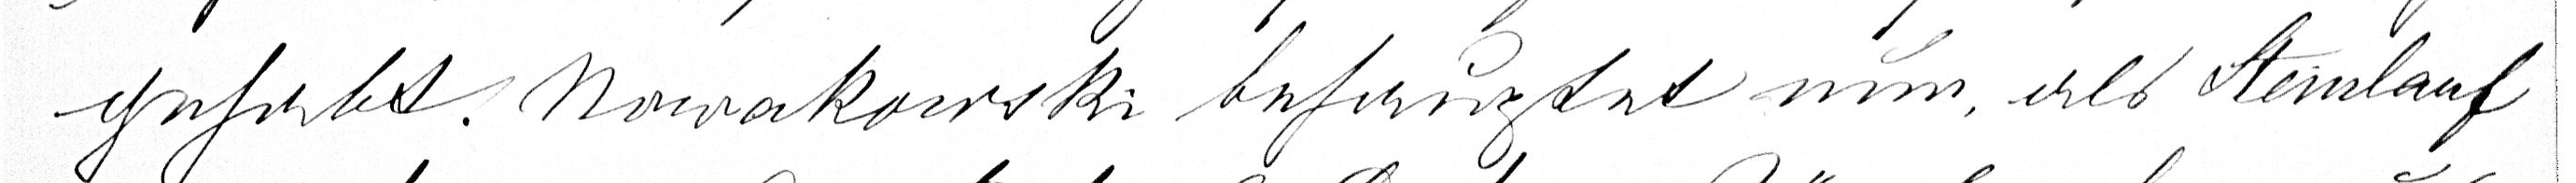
gehabt. Nowakowski behauptet nun, als Steinlauf
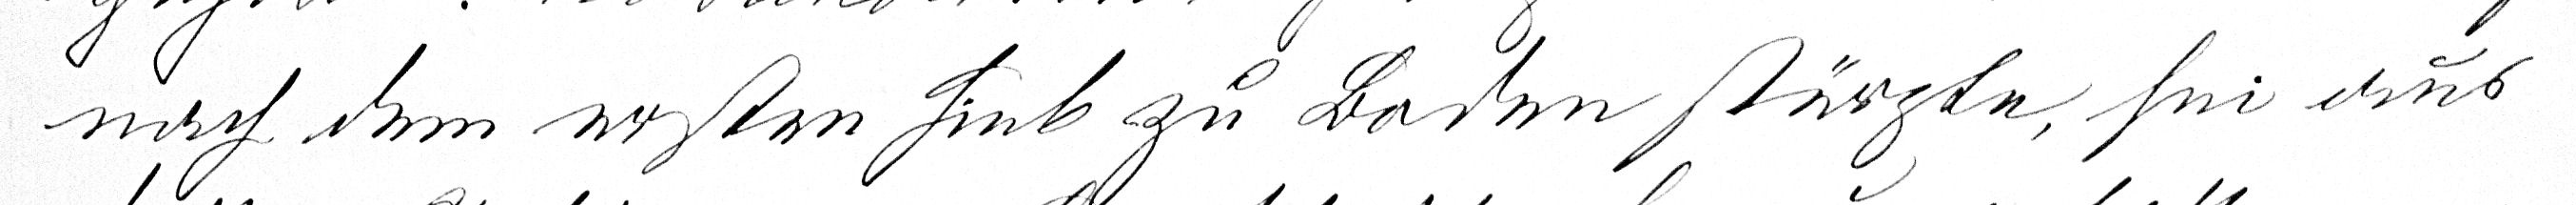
nach dem ersten Hieb zu Boden stürzte, sei aus
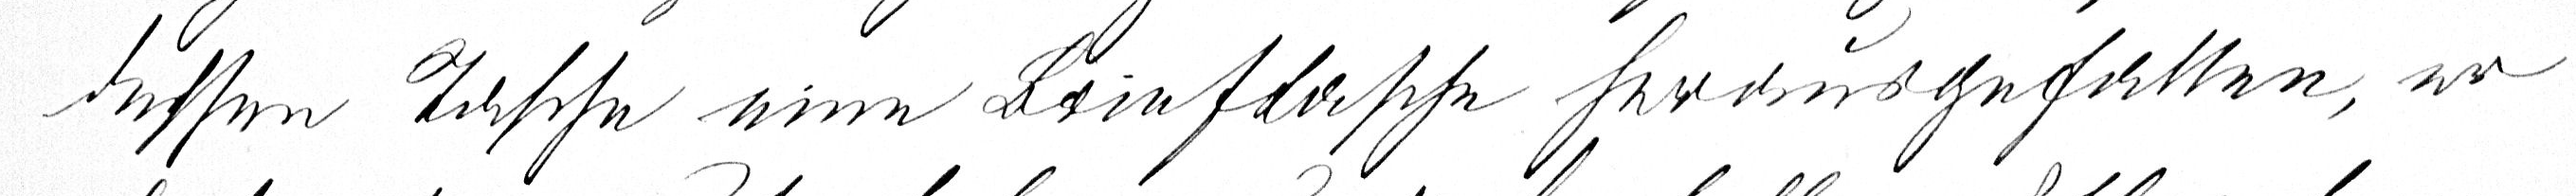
dessen Tasche eine Brieftasche herausgefallen, er
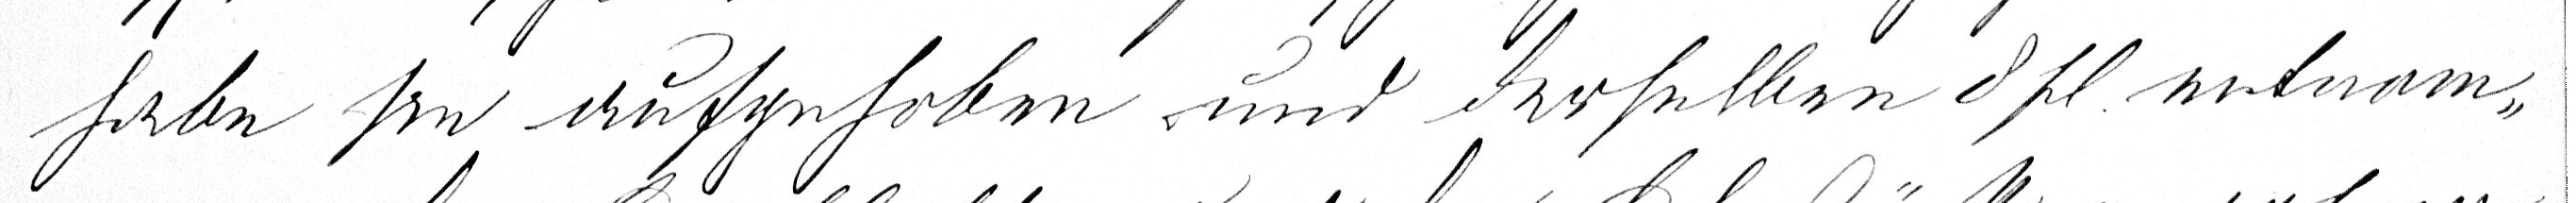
habe sie aufgehoben und derselben 8 fl. entnom¬
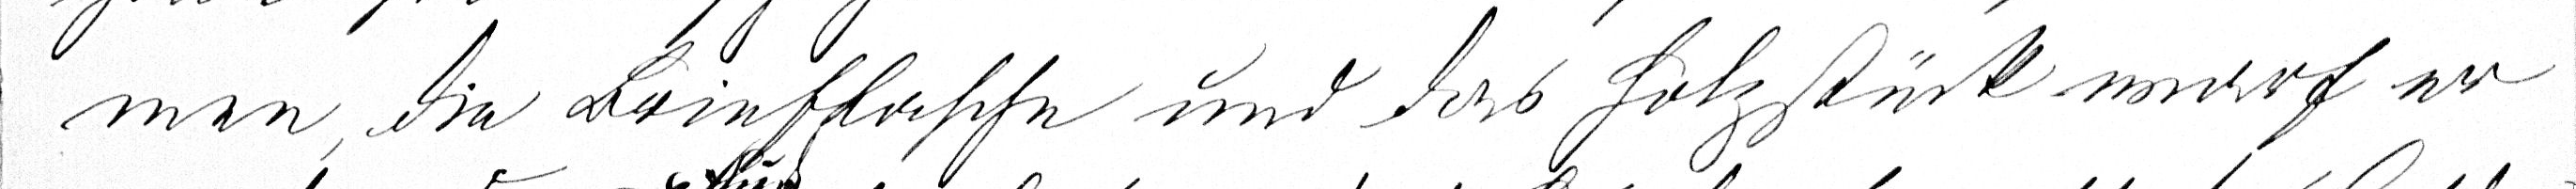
men, die Brieftasche und das Holzstück warf er
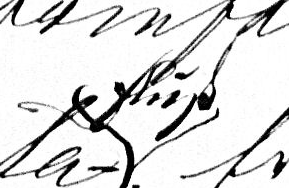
fuß.
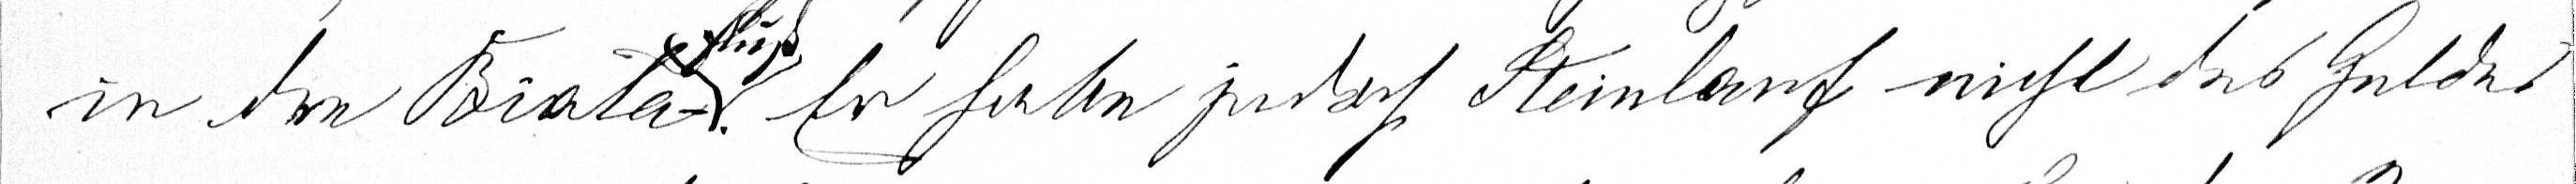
in den Biala Er habe jedoch Steinlauf nicht des Geldes
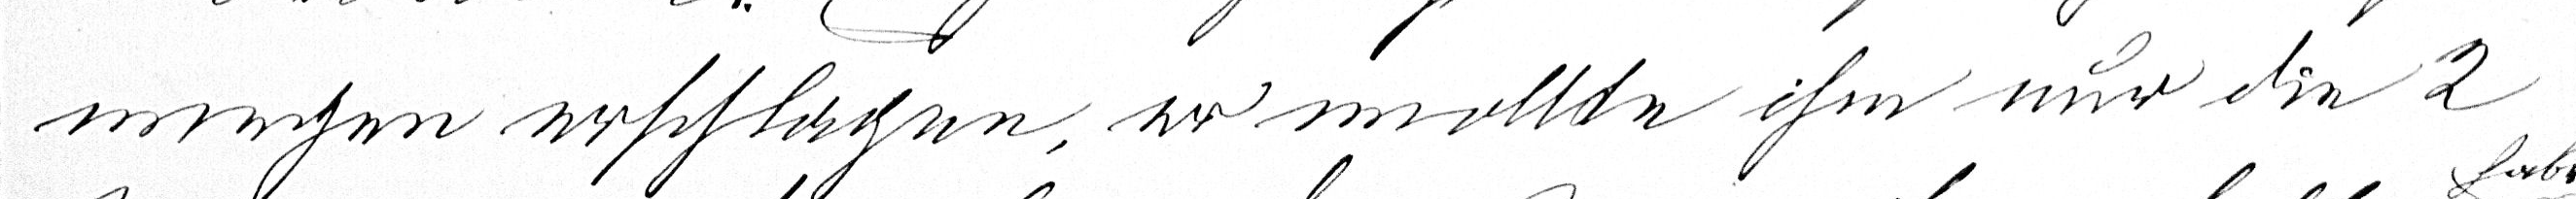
wegen erschlagen, er wollte ihm nur die 2
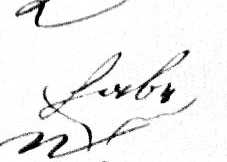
habe.
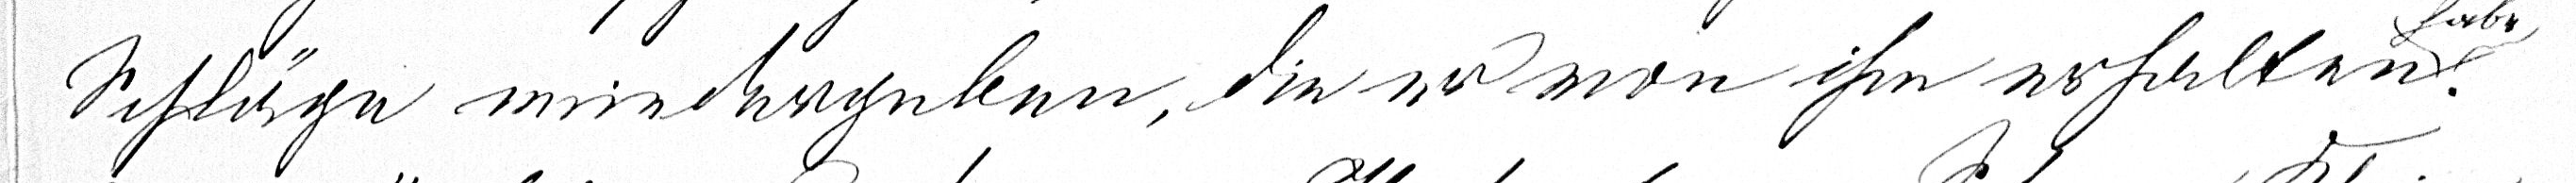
Schläge wiedergeben, die er von ihn erhalten
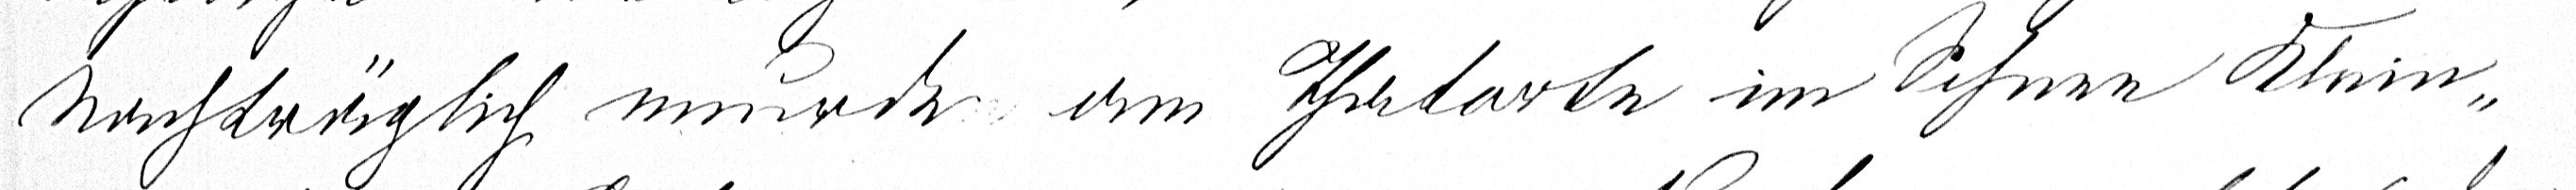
Nachträglich wurde am Thatarte im Schnee Klein¬
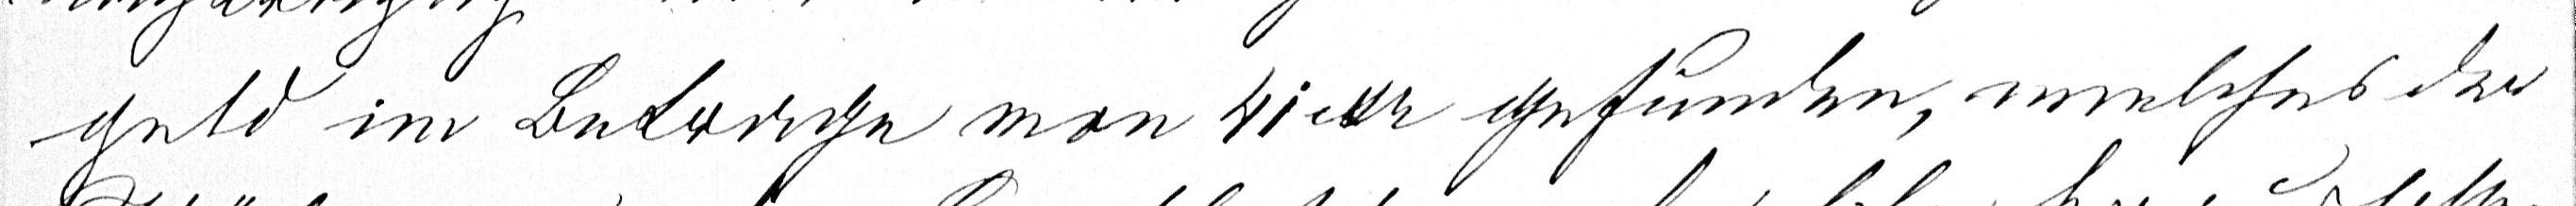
geld im Betrage mon 41 xx gefunden, welches der
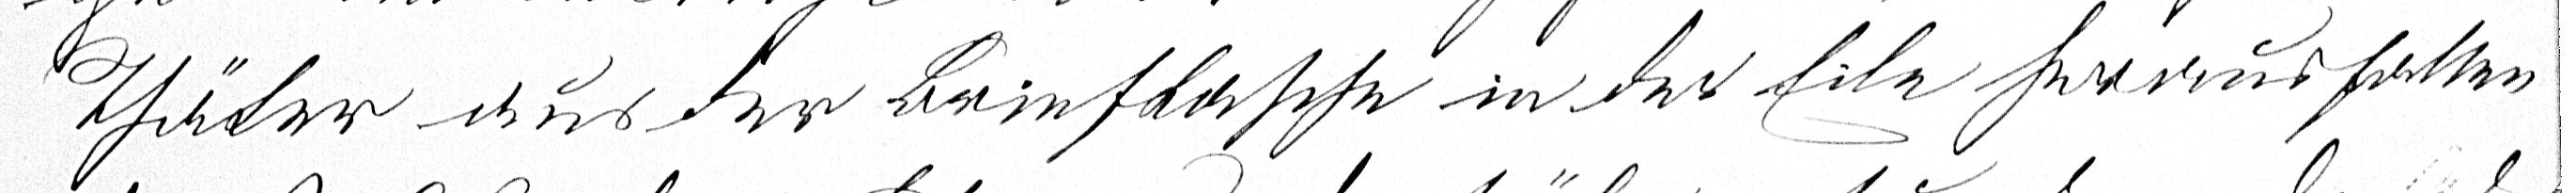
Thäter aus der Brieftasche in der Eile heraushalten
